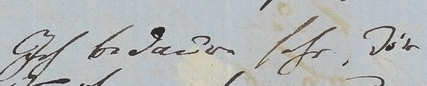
Ich bedaure sehr, Dir
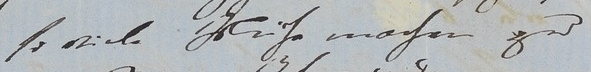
so viele Mühe machen zu
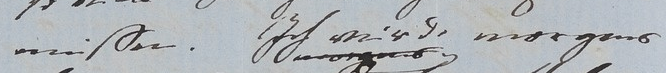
müssen. Ich würde morgens
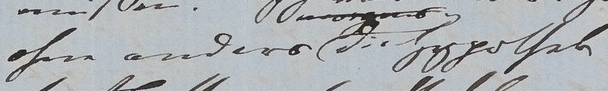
ohne anders morgens die Hypothek
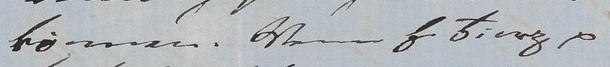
können. Wenn H. Fierz &
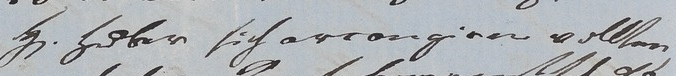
H. Huber sich arrangiren wollten,
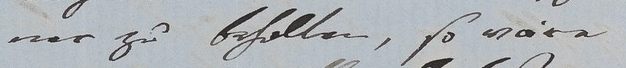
ner zu behalten, so wäre
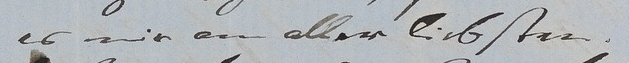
es mir am aller liebsten.
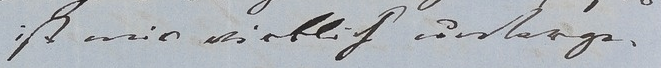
ist mir wirklich unterge-
